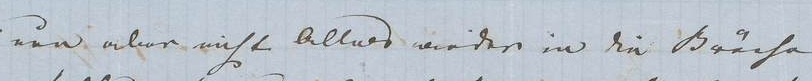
nun aber nicht Alles wieder in die Brüche
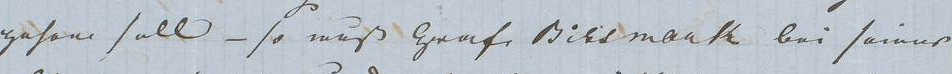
gehen soll – so muß Graf Bissmark bei seiner
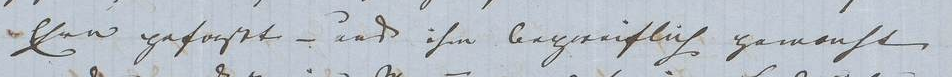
Ehre gefaßt – und ihm begreiflich gemacht
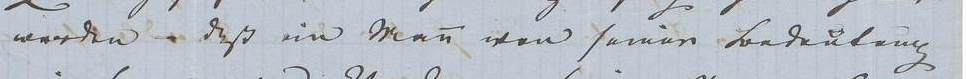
werden – daß ein Mann von seiner Bedeutung
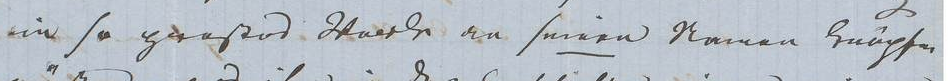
ein so großes Werk an seinen Namen knüpfen
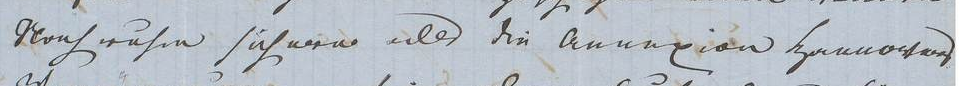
Nachruhm sichere als die Annexion Hannovers.
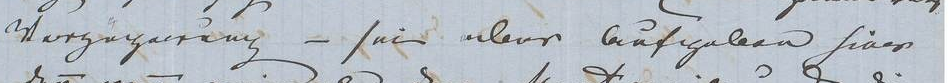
Verzögerung – sei aber Aufgeben hier
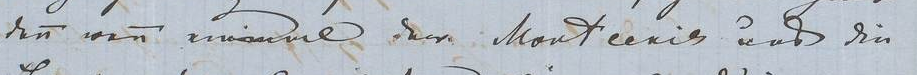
denn wenn einmal der Montcenis und die
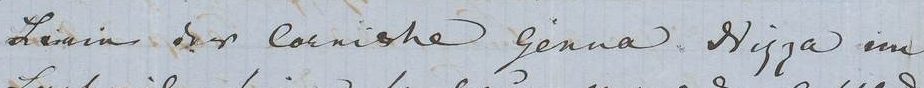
Linie der Corniche GenuaNizza im
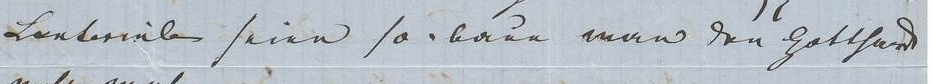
Betrieb seien so baue man den Gotthard
